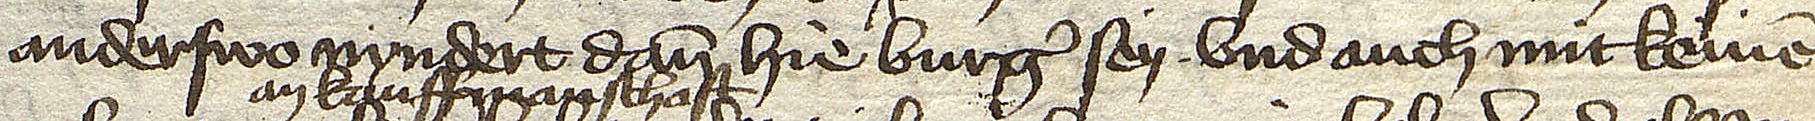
anderſwo nyndert dan* hie burg* ſey . vnd auch mit keine*
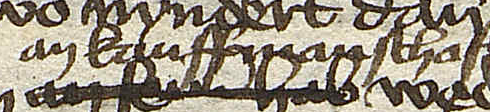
an kauffmanſchaft
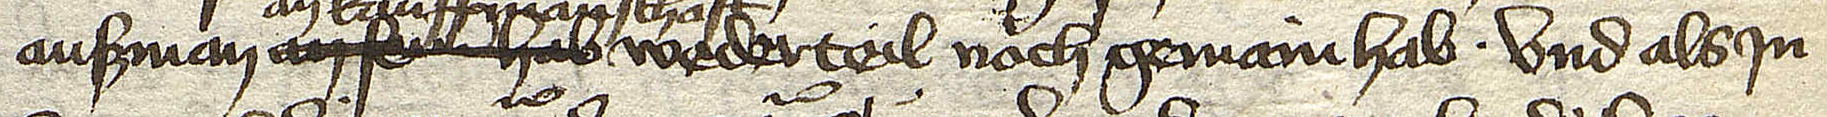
auſʒman an ſein* hab wederteil noch gemain hab . Vnd als In
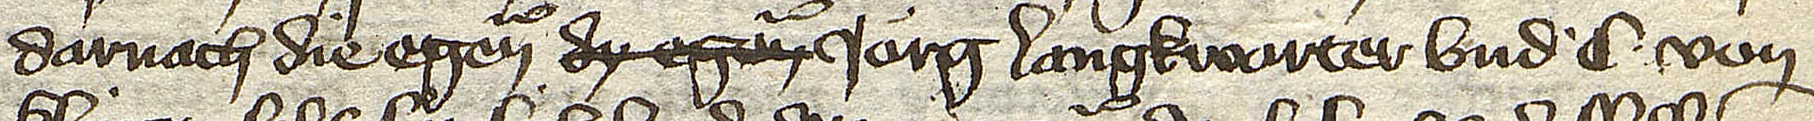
daranch die egen* dy egen* Iörg langkwarter vnd . C . von
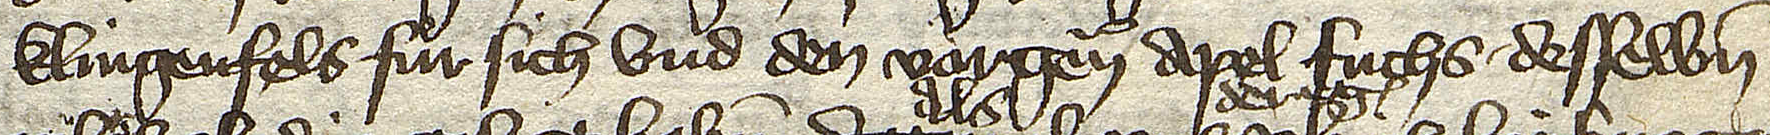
klingenfels für ſich vnd den vorgen* Apel Fuchs / deſſelbn*
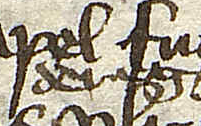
dem eg*
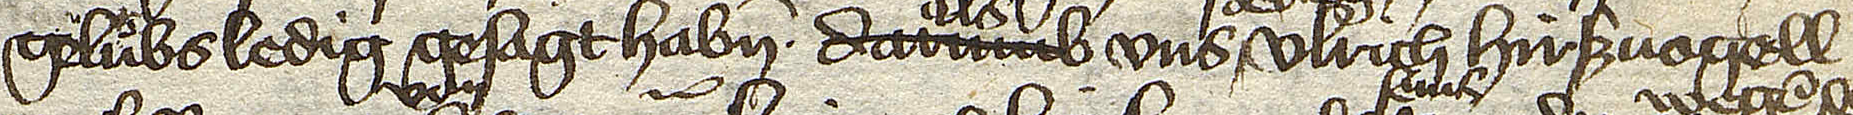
gelübs ledig geſagt habn* . Darumb vns vlrich hirſʒuogell
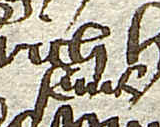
ſeins
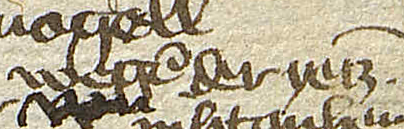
wege* der yecʒ*
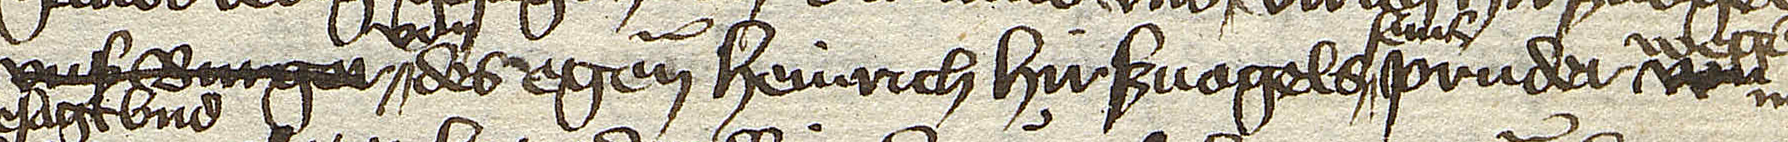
vnſ* Burger des egen* heinrich hirſʒuogels pruder von
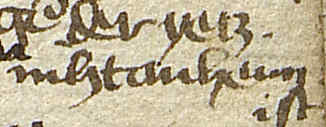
niht anheim
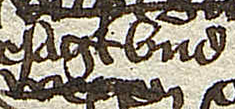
geſagt vnd
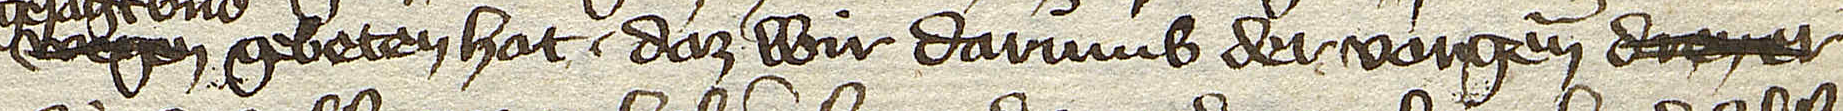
wegen gebeten hat / daʒ wir darümb der vorgen* dreyer
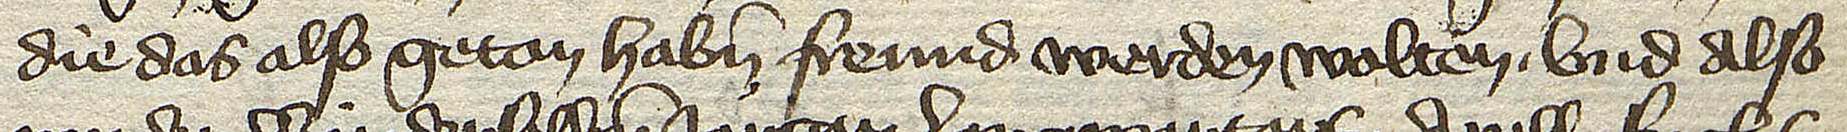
die das alſo getan habn* freund werden wolten / vnd Alſo
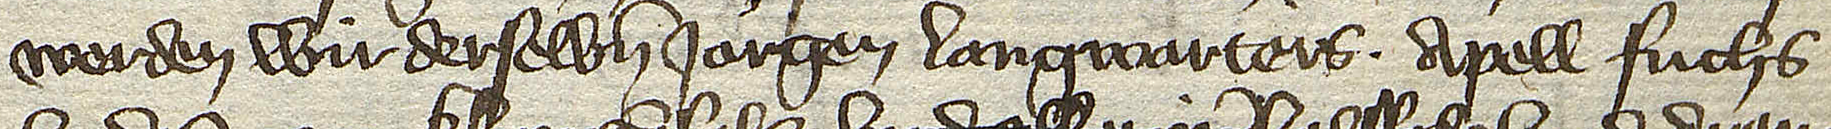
werden wir derſelbn* Iörgen langwarters . Apell Fuchs
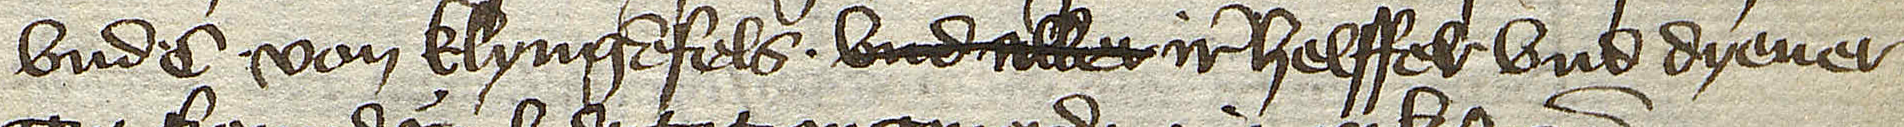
vnd . C . von klynge*fels . vnd aller ir* helffer vnd dyener
